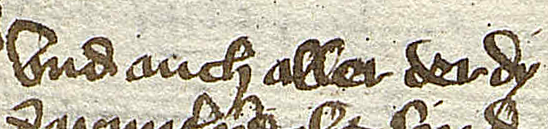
vnd auch aller der dy
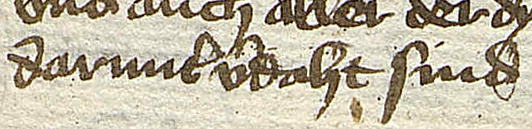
darunt* v*daht ſind
